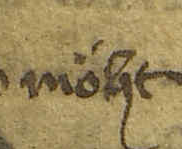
möht
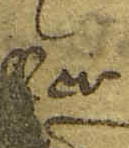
ller
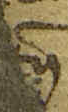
tn*
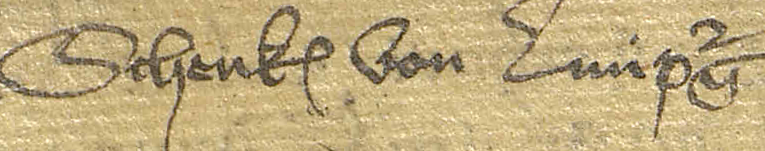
Schenk* von Limp*g
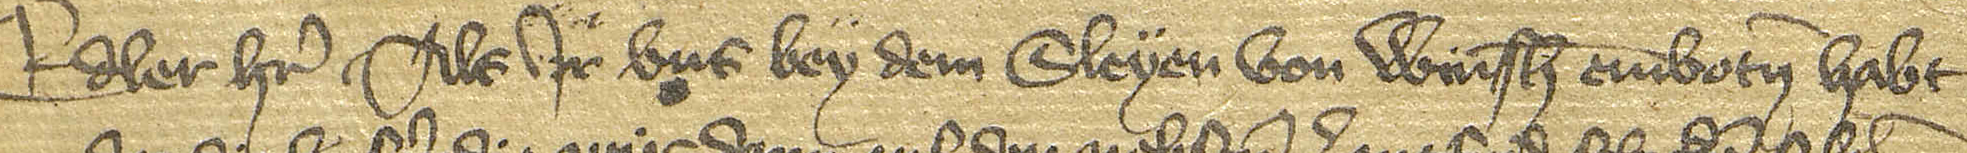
Edler hr* / Als Ir vns bey dem Sleyen von Winſh* embotn* habt
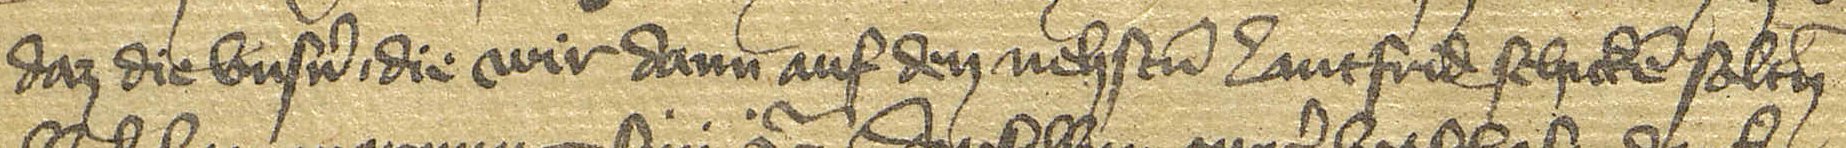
daʒ die vnſn* / die wir dann auf den nehſtn* Lantfrid ſchicke* ſoltn*
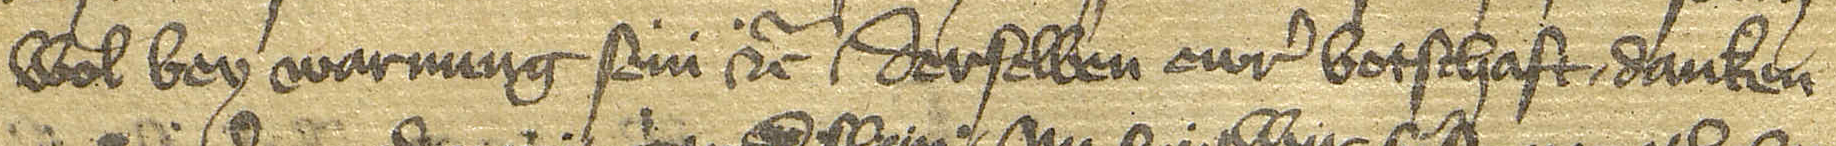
wol bey warnung ſein ec* / Derſelben ewr* botſchaft / danken
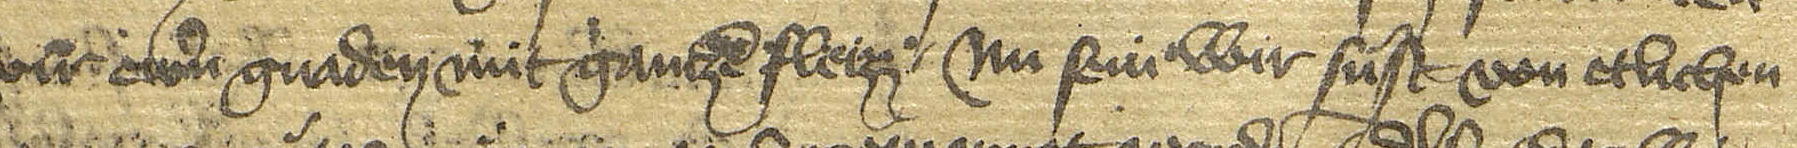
wir ew*n gnaden mit gancʒe* fleiʒʒ / Nu ſein wir ſüſt etlichen
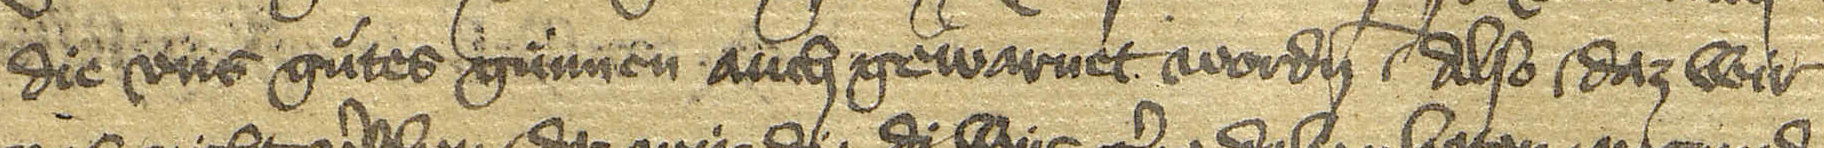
die vns gütes günnen auch gewarnet wordn* / Alſo / daʒ wir
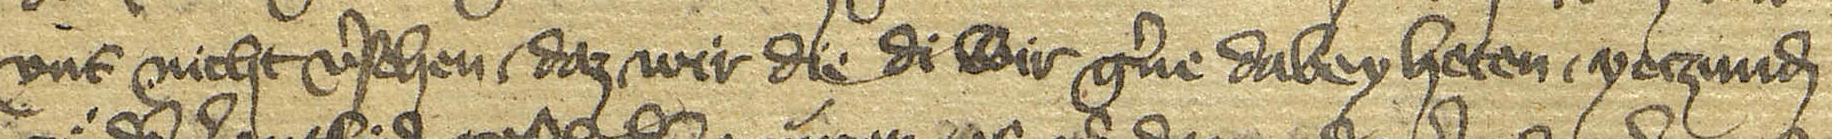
vns nicht v*ſehen / daʒ wir die di wir g*ne dabey heten / yecʒund*
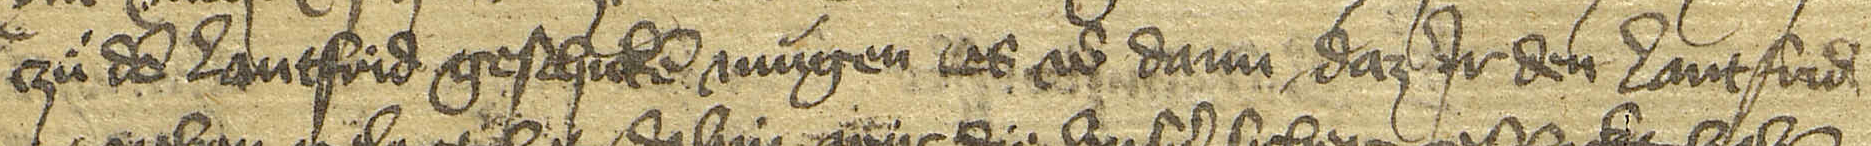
cʒü de* Lantfrid geſchicke* mügen es w* dann / daʒ Ir den Lantfrid
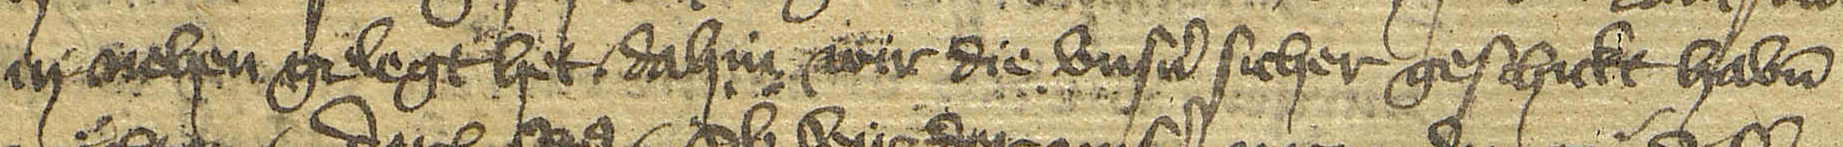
in nehen gelegt het / dahin wir die vnſn* ſicher geſchickt habn*
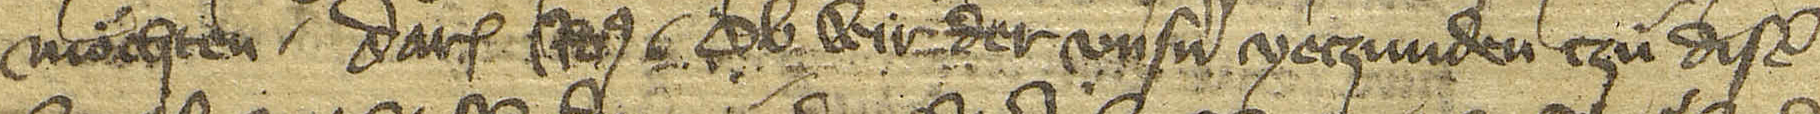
möchten / Dar* Ro* / Ob wir der vnſn* yecʒunden cʒü diſe*
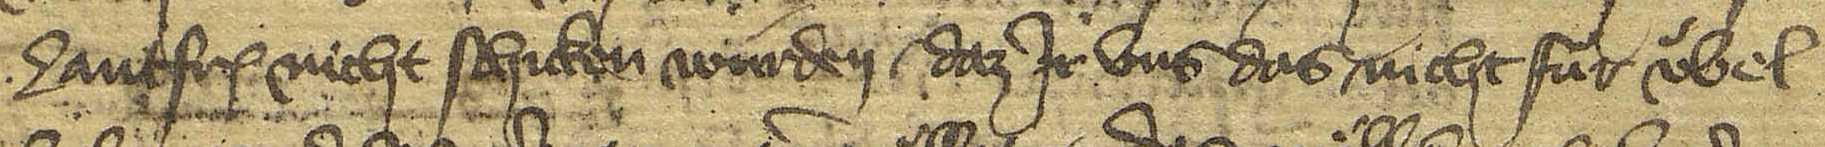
Lantfr* nicht ſchicken würden / daʒ Ir vns das nicht für v̈bel
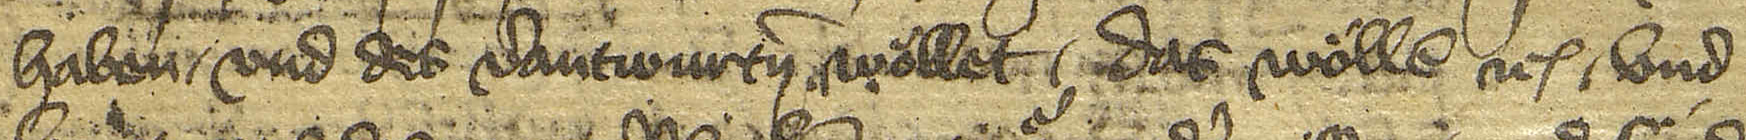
haben / vnd des v*antwurtn* wöllet / das wölle* ec* / vnd
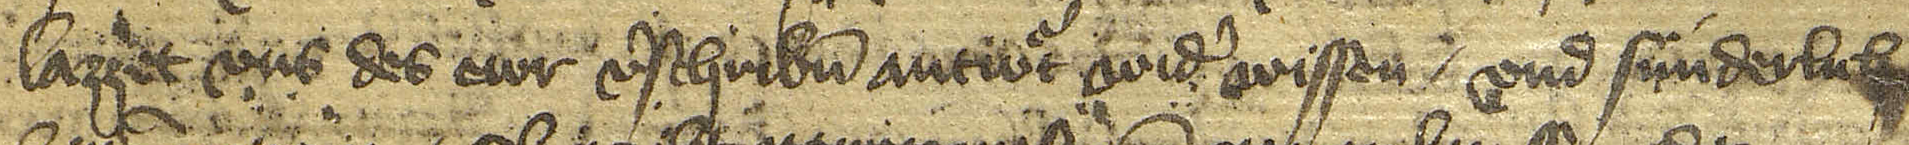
laʒʒet vns des ewr v*ſchribn* antw*t wid* wiſſen / vnd ſünderlich
